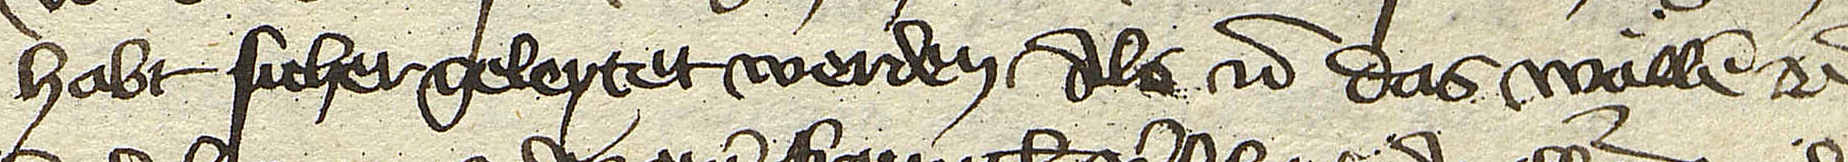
habt ſicher geleytet werden / Als ec* das wölle* ec*
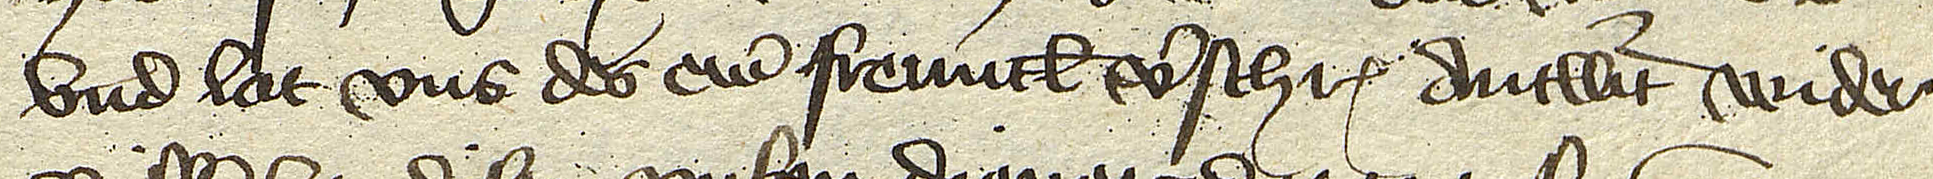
vnd lat vns des ew* freuntl* v*ſchr* Antwt* wider
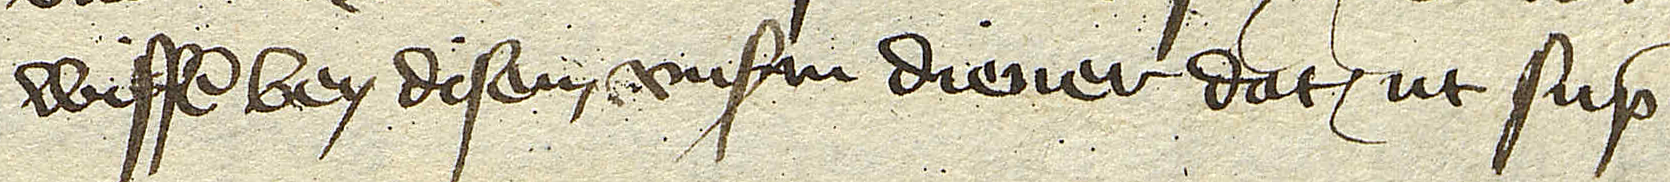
wiſſe* bey diſem vnſ*m diener dat* ut ſup*
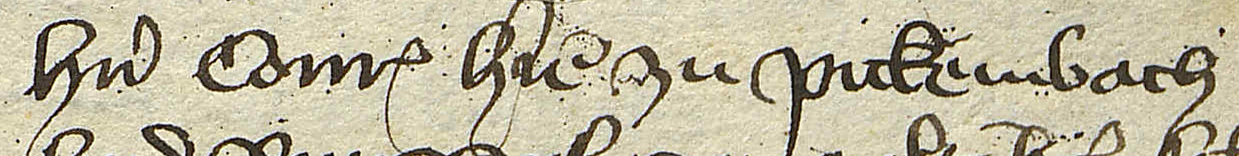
hn* Conr* h*re cʒu pickembach
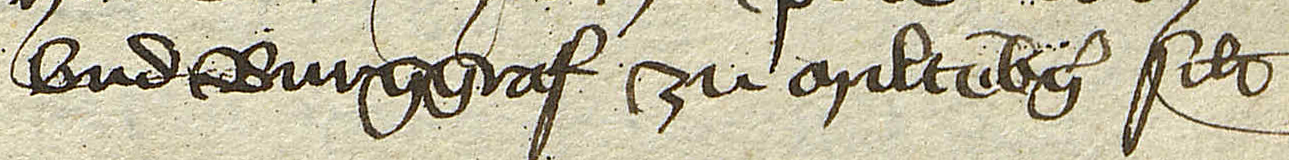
vnd Burggraf cʒu Milte*b*g ſilr*
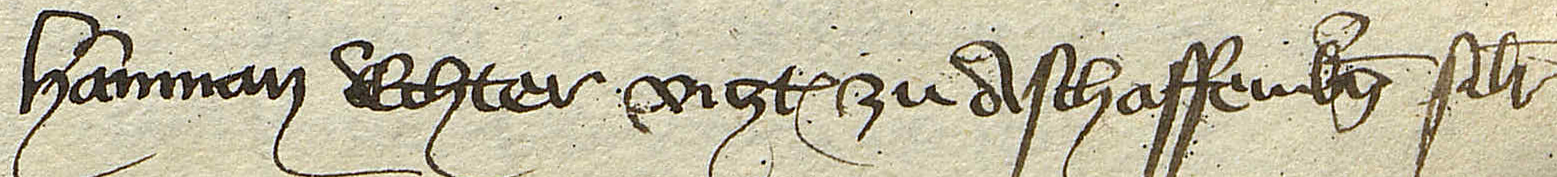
Ha*mman Echter vicʒt cʒu Aſchaffemb*g ſilr*
